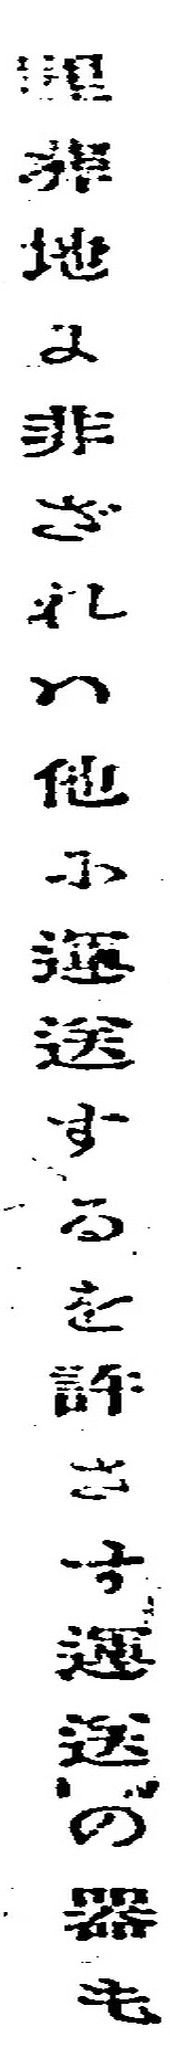埋葬地に非ざれは他に運送するを許さす運送の器も
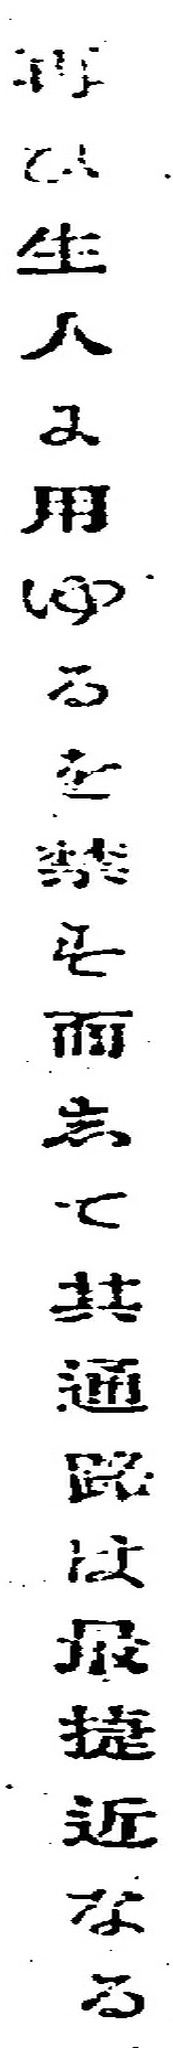再ひ生人に用ゆるを禁す而して其通路は最捷近なる
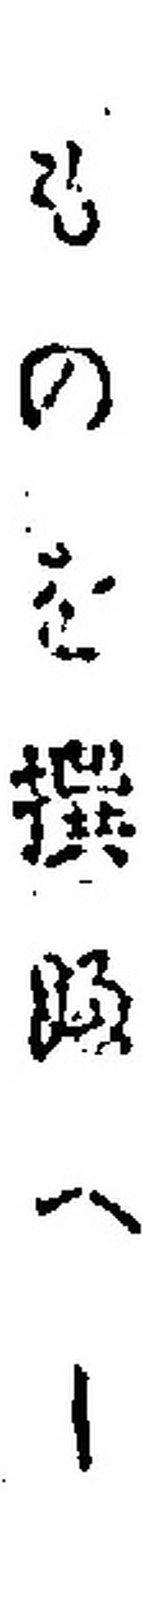ものを撰ふへし
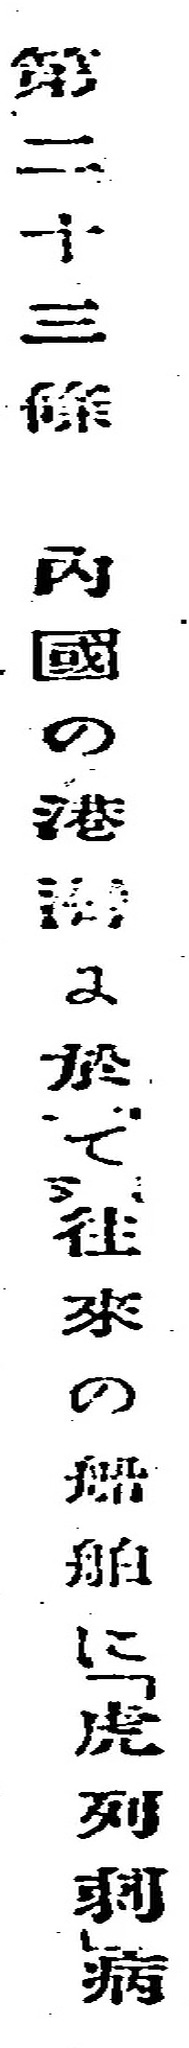第二十三条内国の港湾に於て往来の船舶に「虎列刺」病
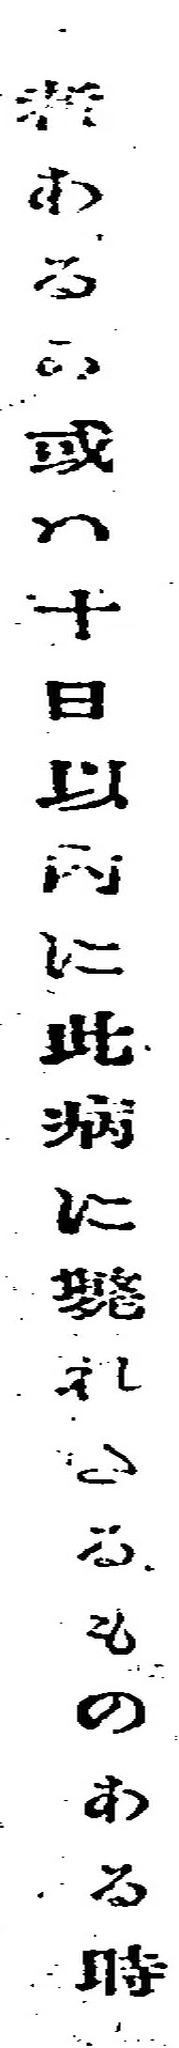者あるか或は十日以内に此病に斃れたるものある時
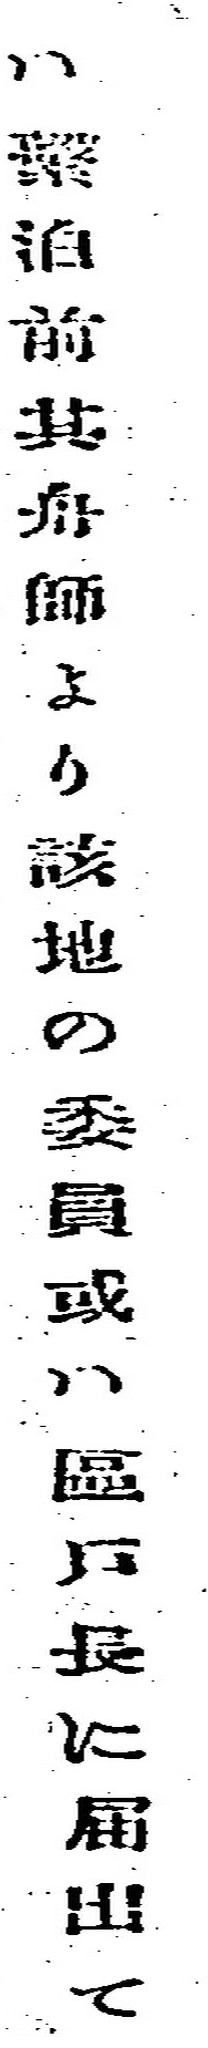は繋泊前其舟師より該地の委員或は区戸長に届出て

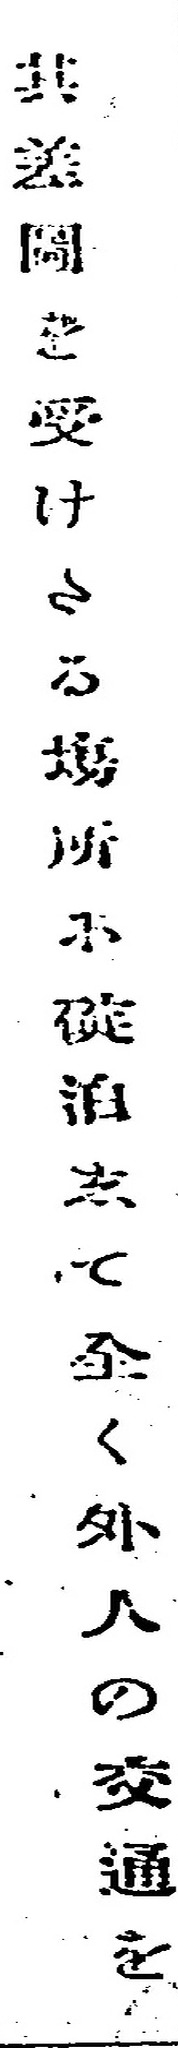其差図を受けたる場所に碇泊して全く外人の交通を
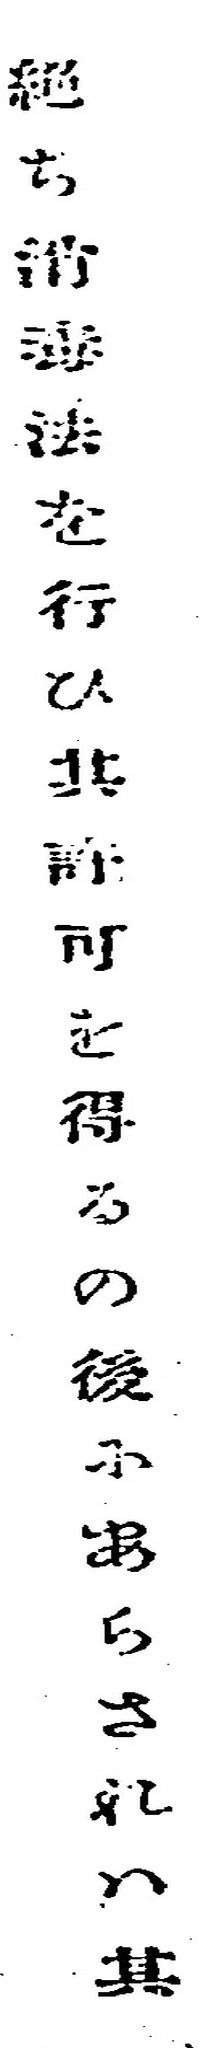絶ち消毒法を行ひ其許可を得るの後にあらされは其
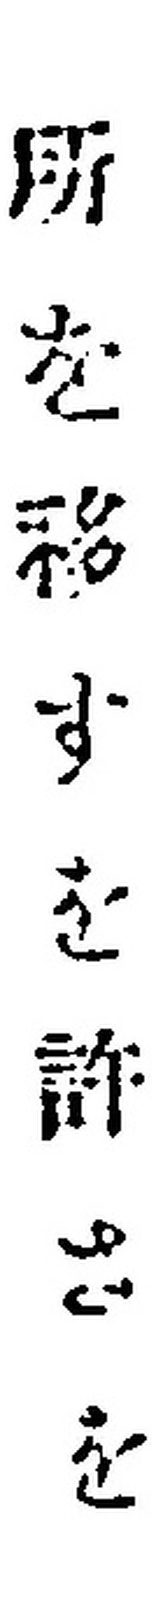所を移すを許さを
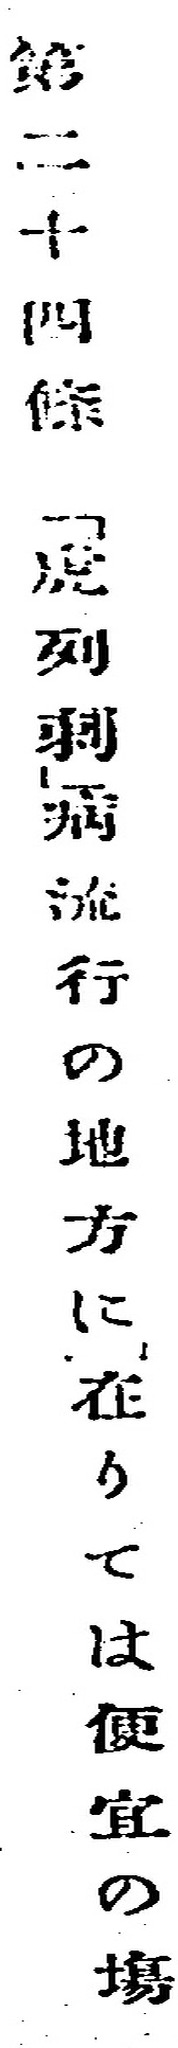第二十四条「虎列刺」病流行の地方に在りては便宜の場
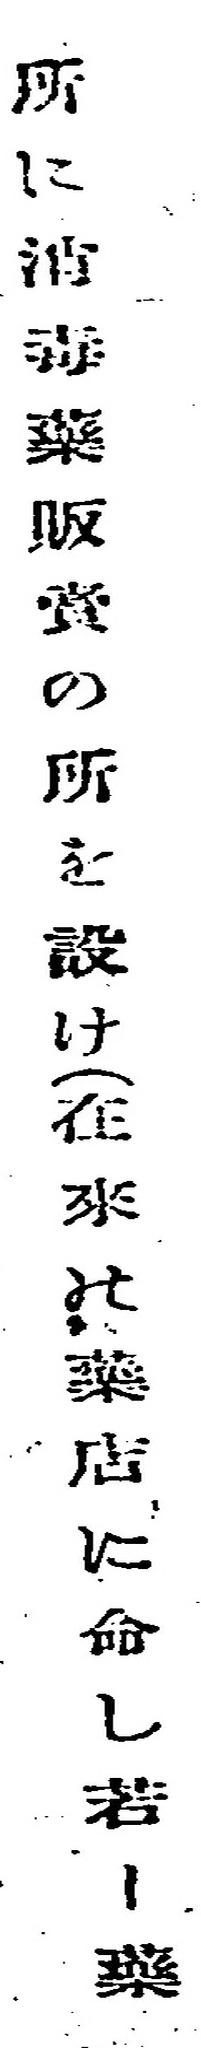所に消毒薬販売の所を設け(在来の薬店に命し若し薬
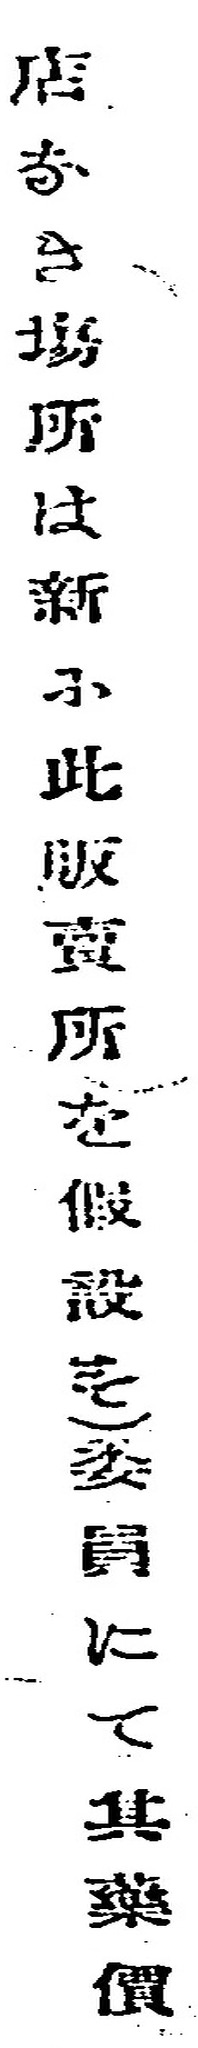店なき場所は新に此販売所を仮設す)委員にて其薬価
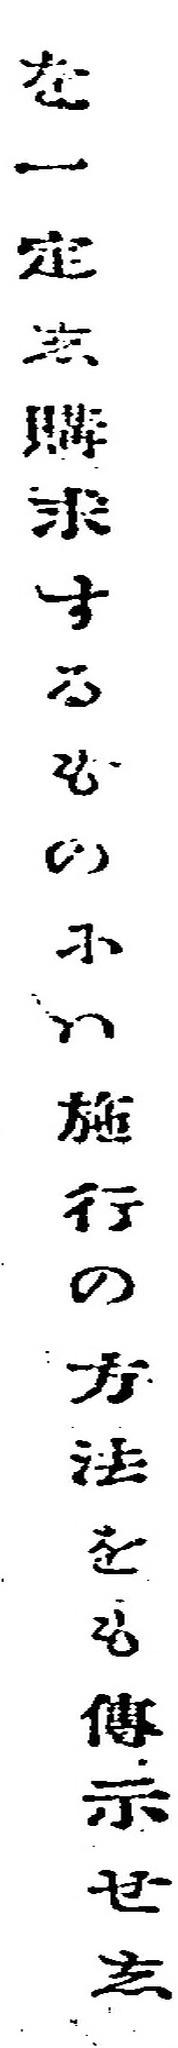を一定し購求するものには施行の方法をも伝示せし
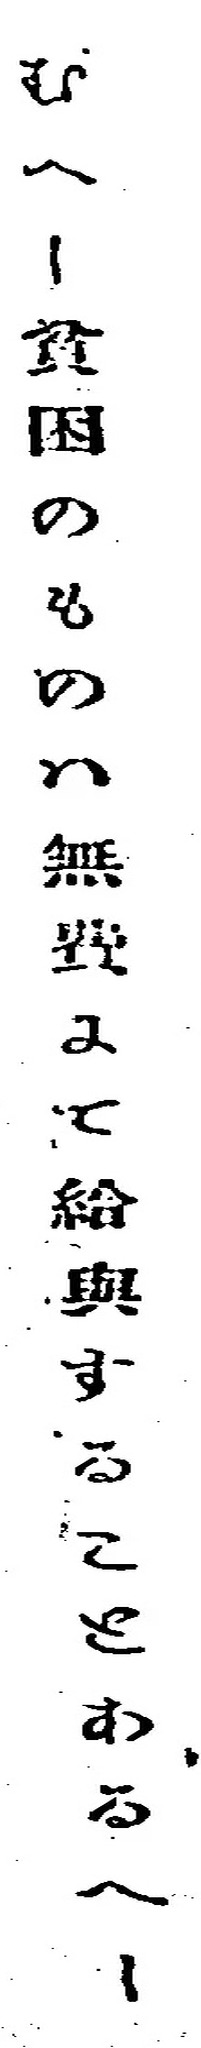むへし貧困のものは無費にて給与することあるへし
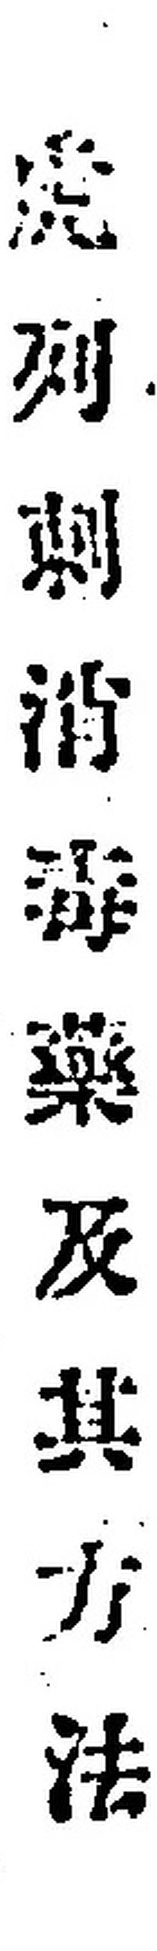虎列刺消毒薬及其方法
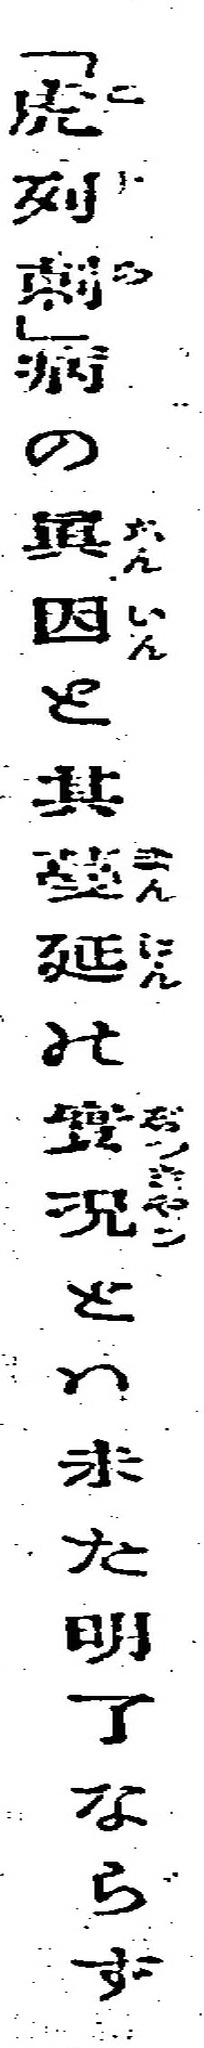「虎列刺」病の真因と其蔓延の実況とは未た明了ならず
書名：これら病予防心得
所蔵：国立国会図書館 National Diet Library, JAPAN
